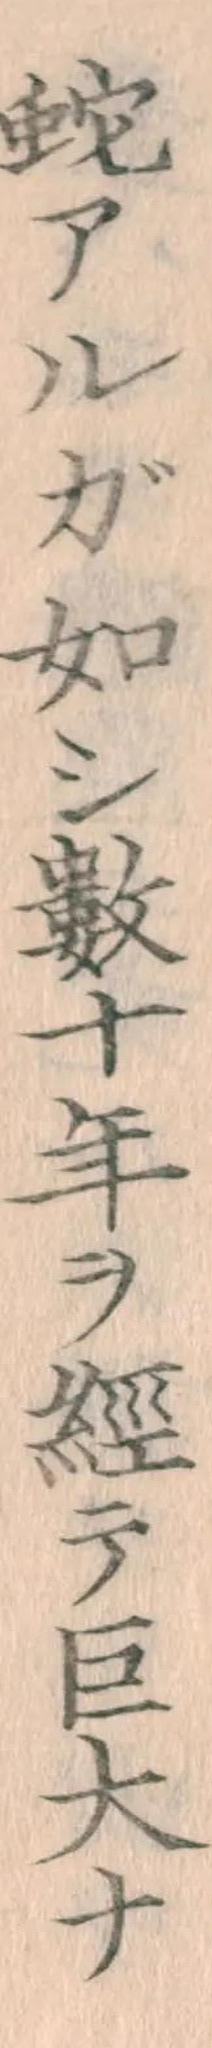蛇アルガ如シ数十年ヲ経テ巨大ナ
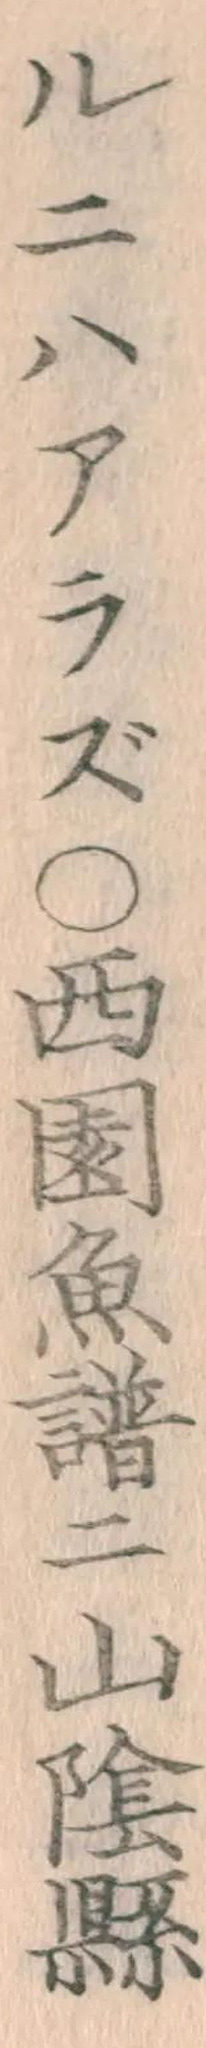ルニハアラズ〇西園魚譜ニ山陰県
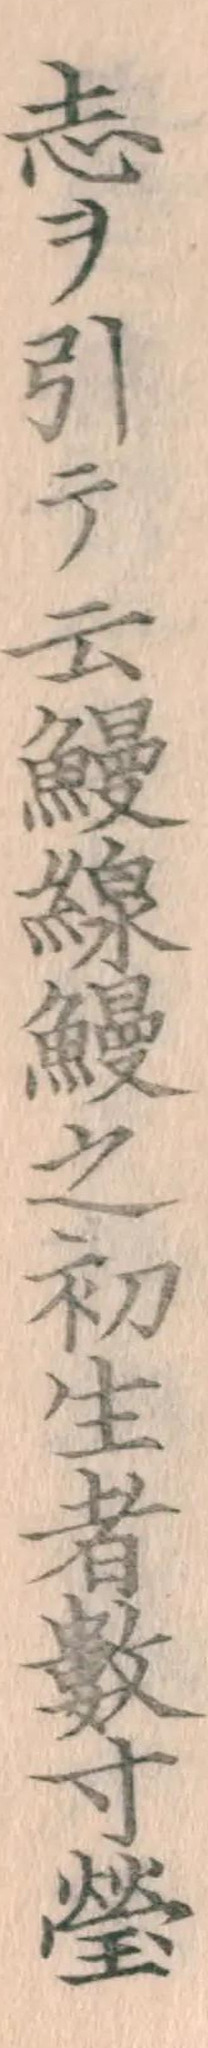志ヲ引テ云鰻線鰻之初生者数寸瑩
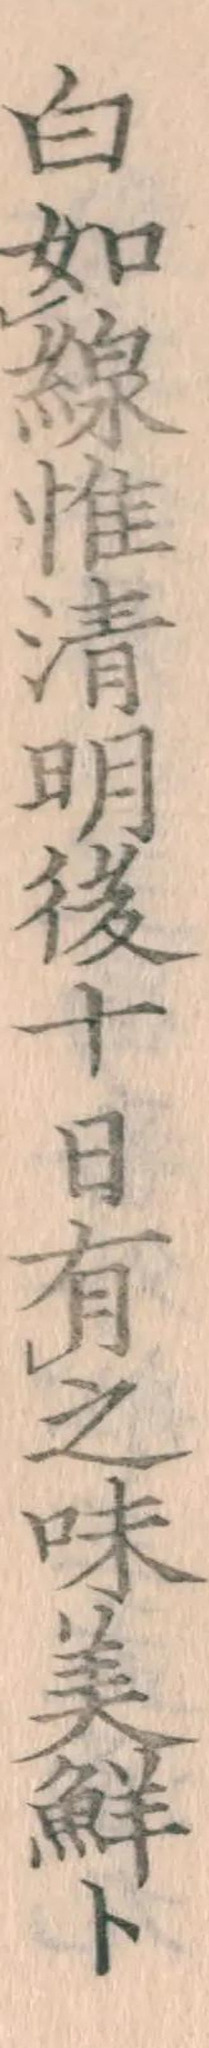白如線惟清明後十日有之味美鮮ト
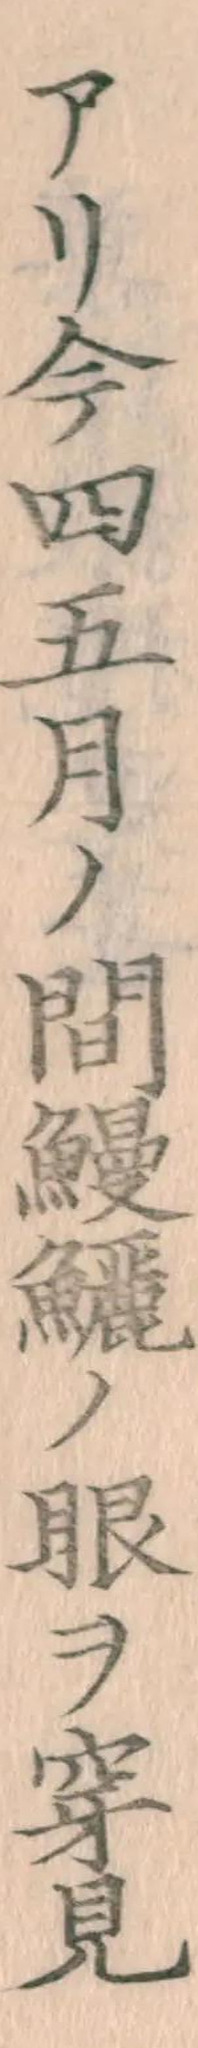アリ今四五月ノ間鰻鱺ノ眼ヲ穿見
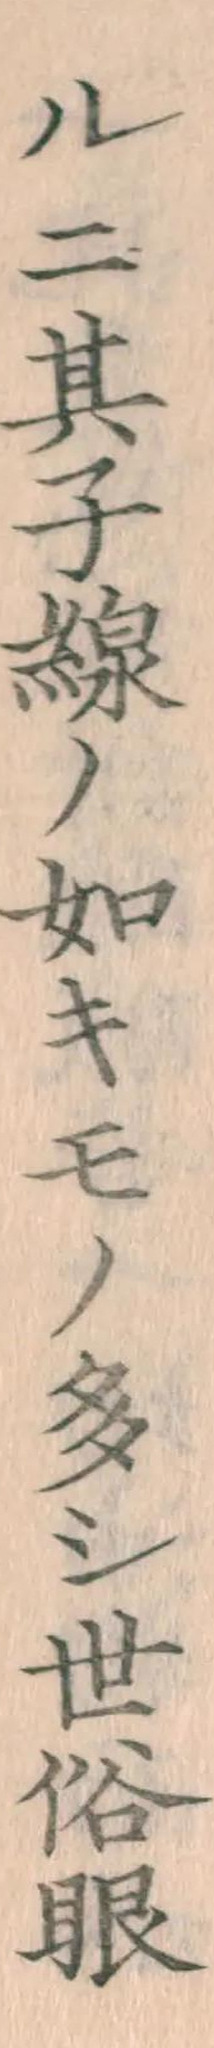ルニ其子線ノ如キモノ多シ世俗眼
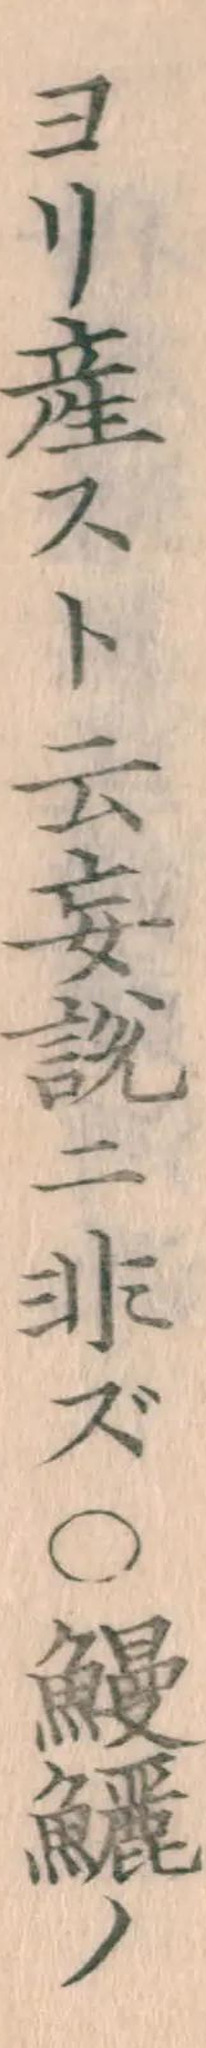ヨリ産スト云妄説ニ非ズ〇鰻鱺ノ
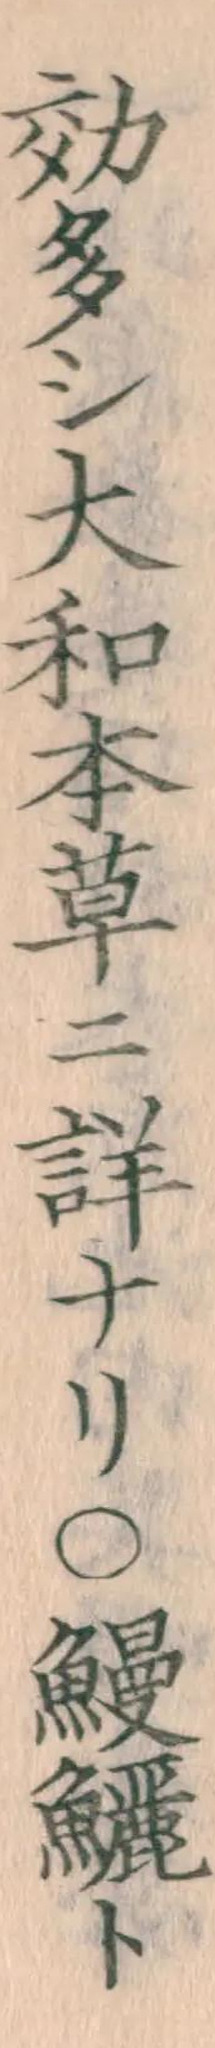効多シ大和本草ニ詳ナリ〇鰻鱺ト
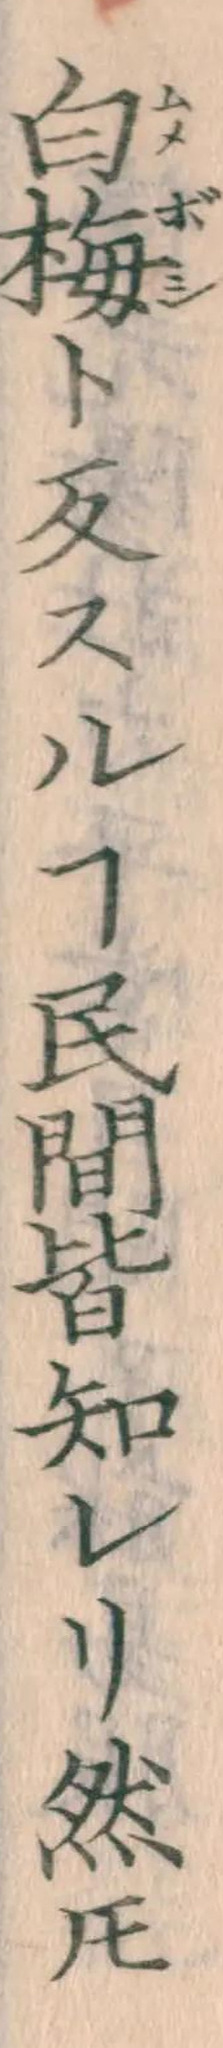白梅ト反スルヿ民間皆知レリ然トモ
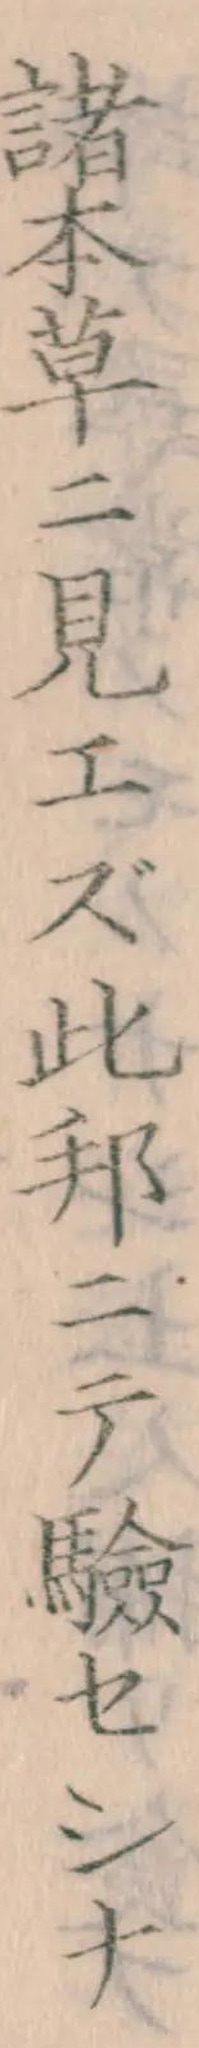諸本草ニ見エズ此邦ニテ験セシナ
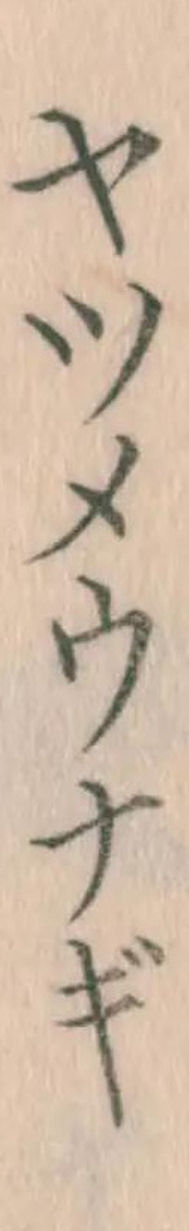ヤツメウナギ
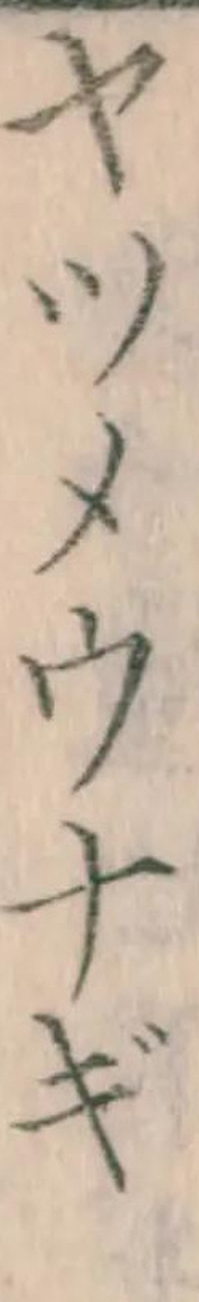ヤツメウナギ
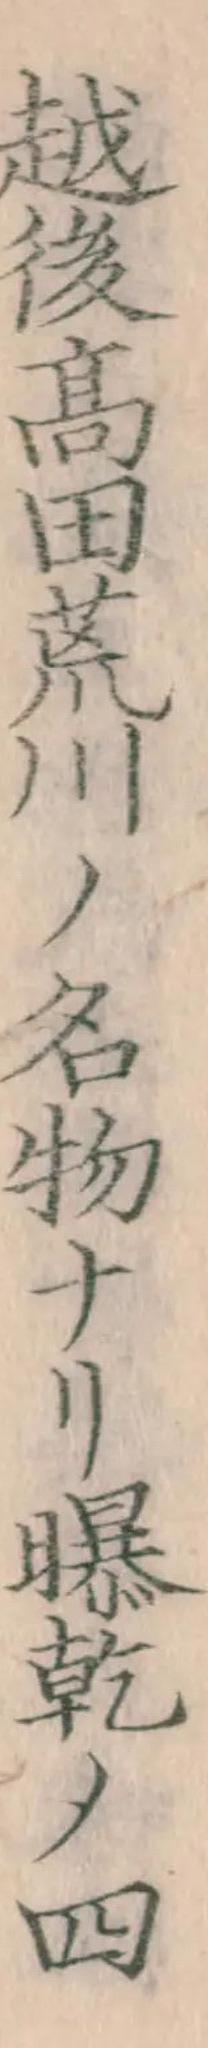越後高田荒川ノ名物ナリ曝乾ノ四
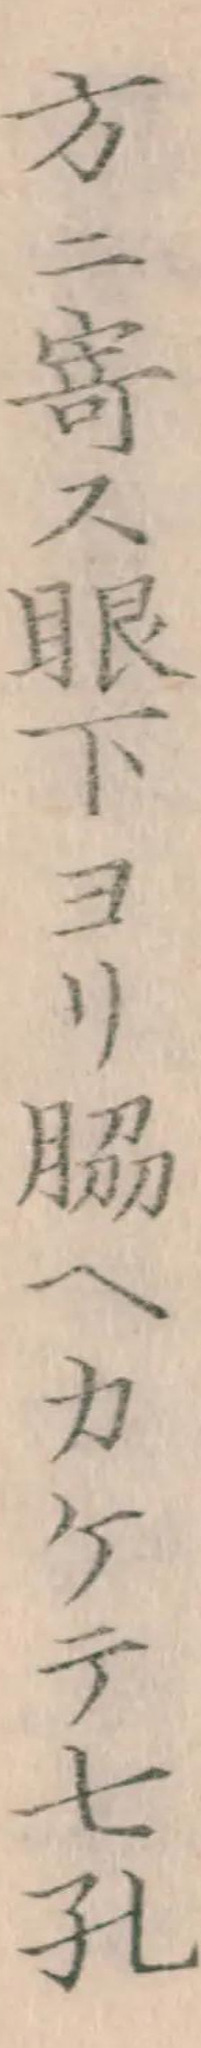方ニ寄ス眼下ヨリ脇ヘカケテ七孔
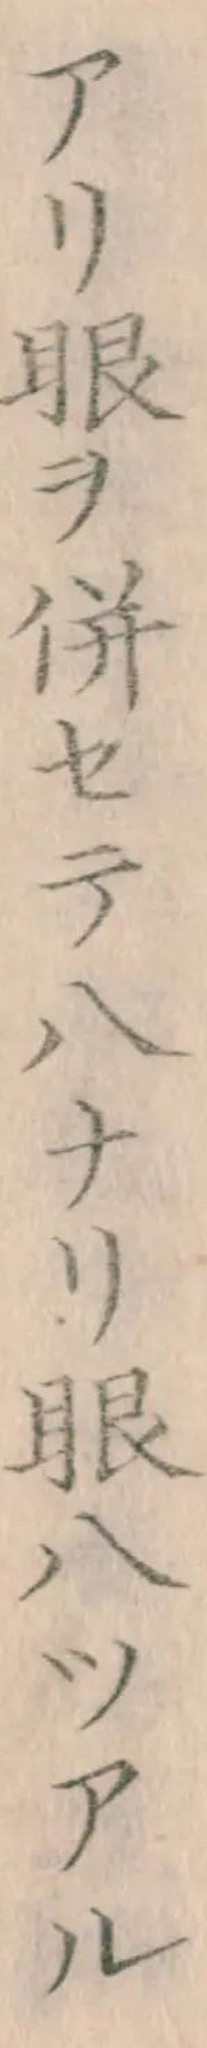アリ眼ヲ併セテ八ナリ眼八ツアル
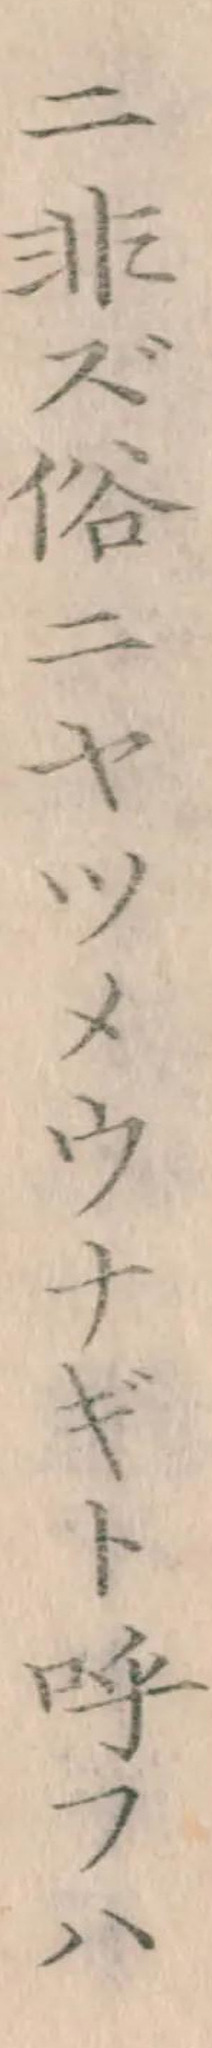ニ非ズ俗ニヤツメウナギト呼フハ
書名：皇和魚譜 2巻
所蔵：国立国会図書館 National Diet Library, JAPAN
